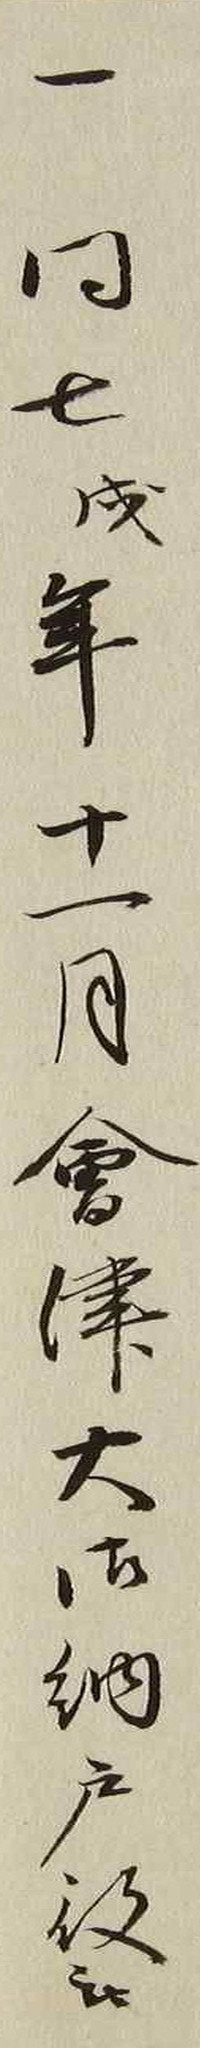一同七戌年十一月会津大御納戸役被
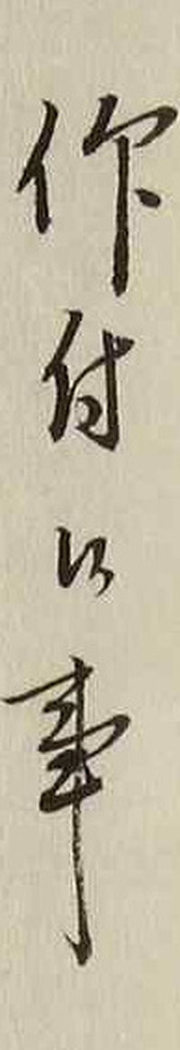仰付候事
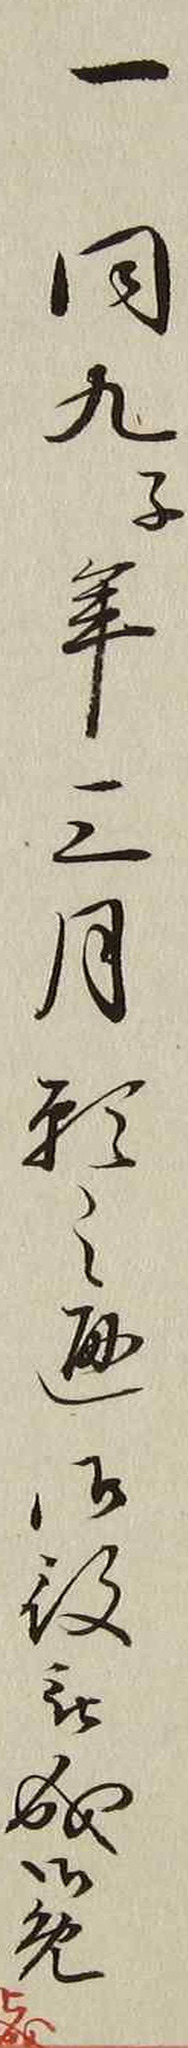一同九子年三月願之通御役被成御免
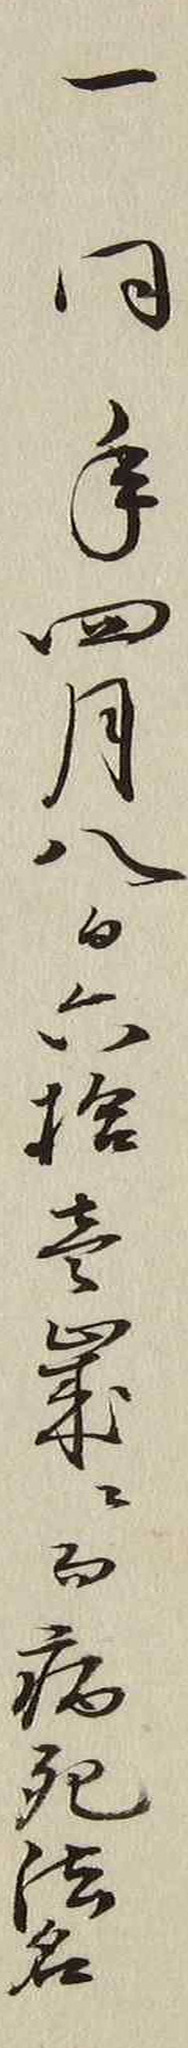一同年四月八日六拾壱歳ニ而病死法名
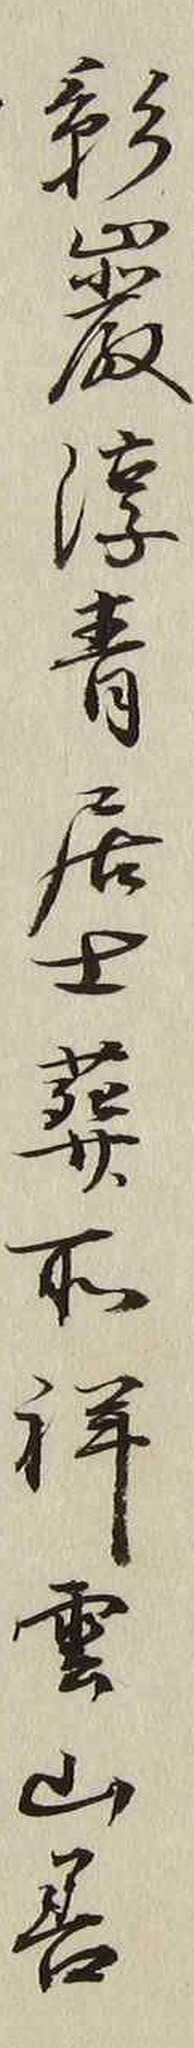彰？巌淳青居士葬所祥雲山善
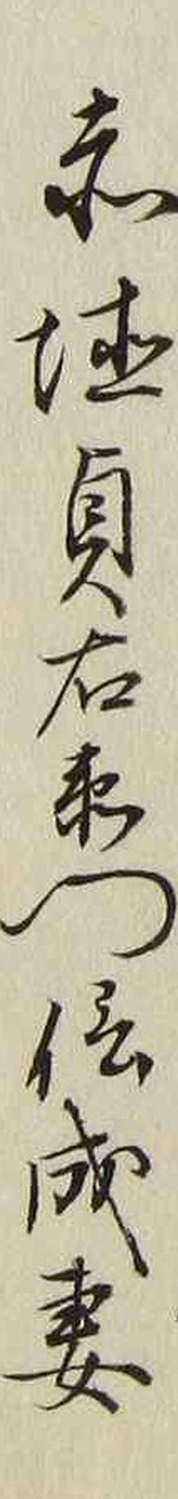赤埴貞右衛門信成妻
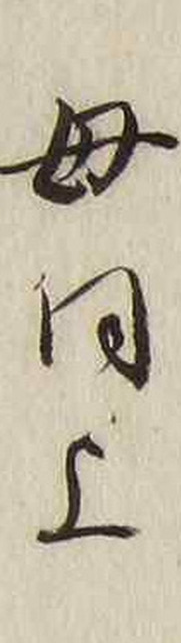母同上

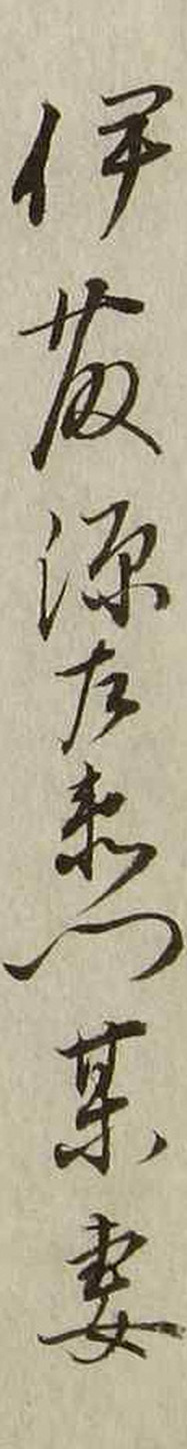女伊藤源左衛門某妻
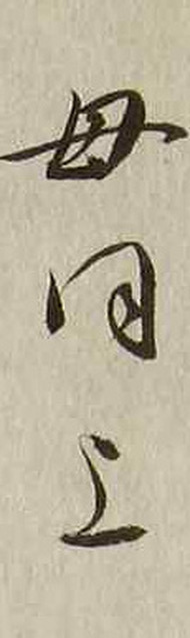母同上
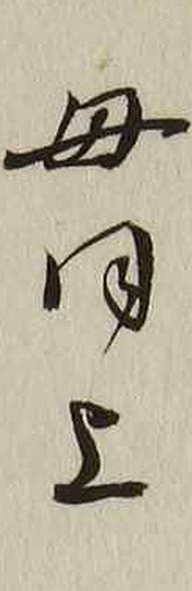母同上
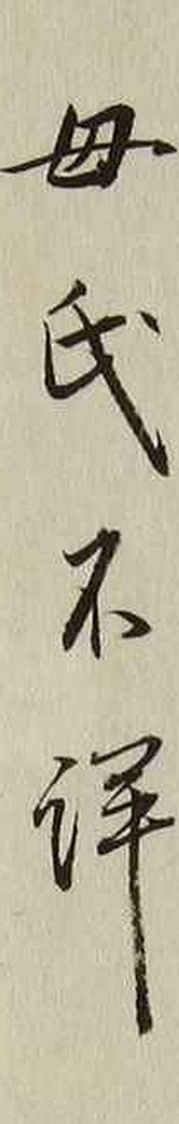母氏不詳
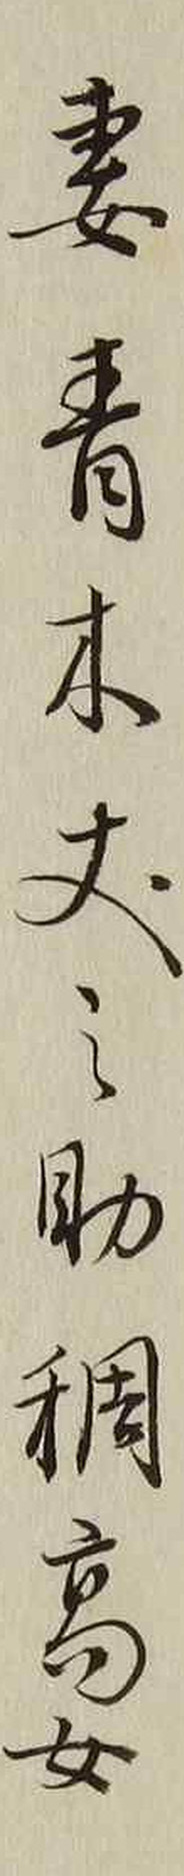妻青木丈之助稠高女
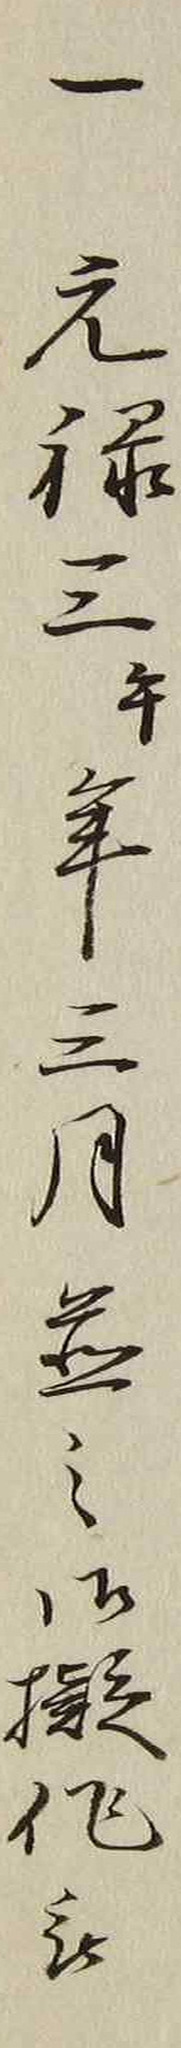一元禄三午年三月並之御擬作被
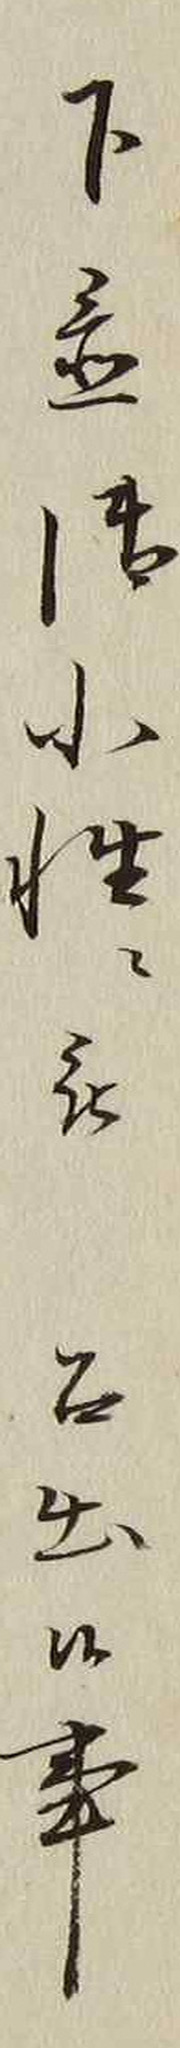下置御小性ニ被召出候事
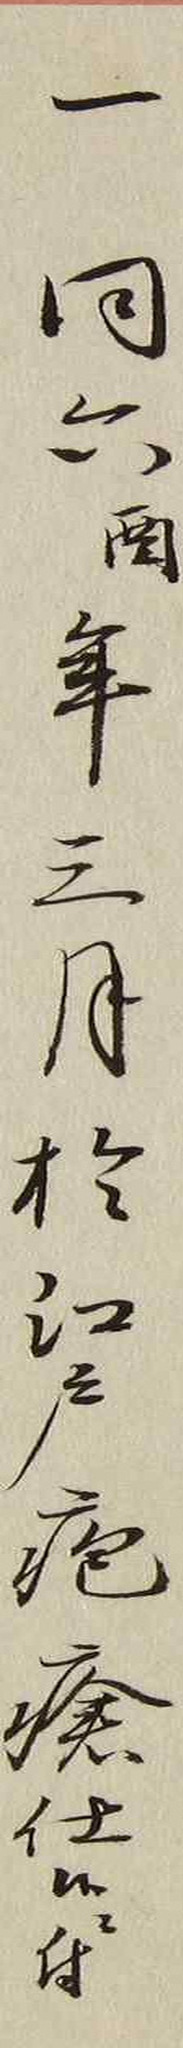一同六酉年三月於江戸庖瘡仕候ニ付
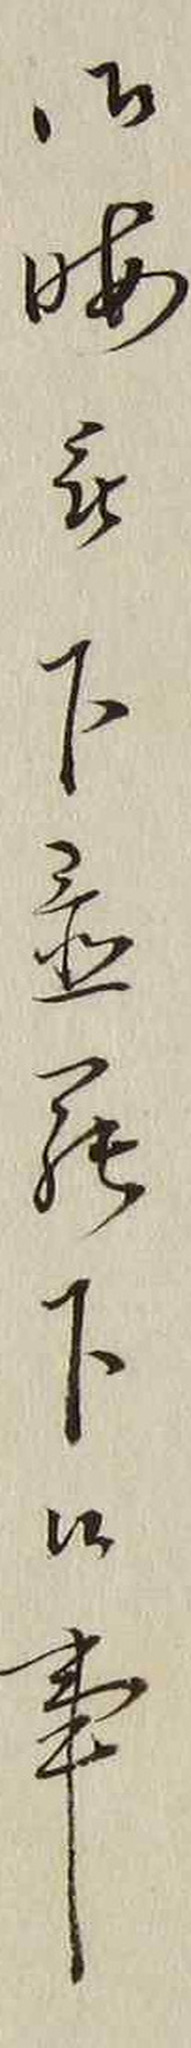御暇被下置罷下候事
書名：諸士系譜　巻之22　い之部22
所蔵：会津若松市立会津図書館
